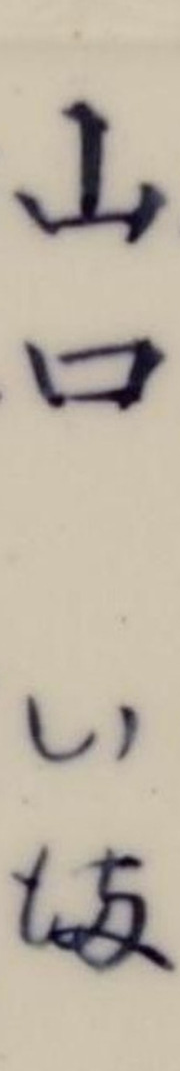山口いま
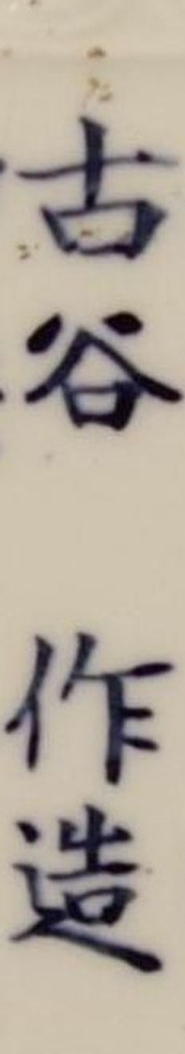古谷作造
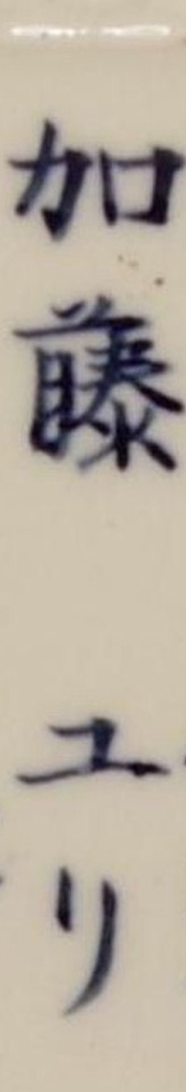加藤ユリ
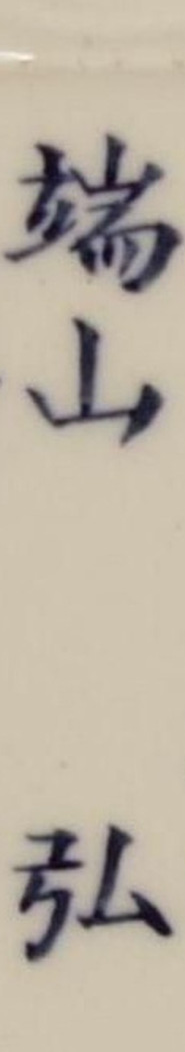端山弘
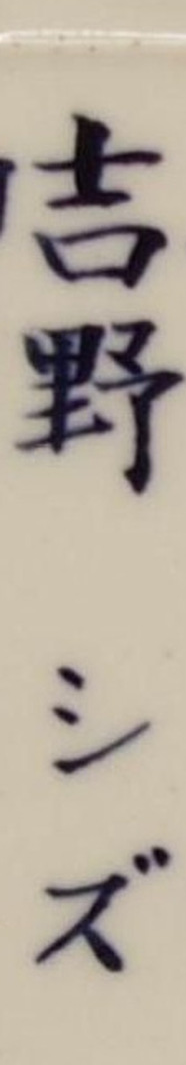吉野シズ
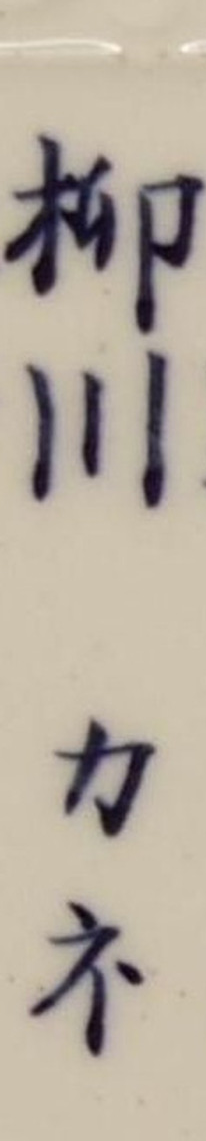柳川カネ
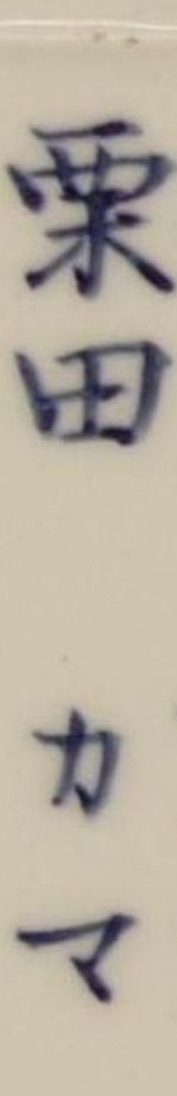栗田カマ
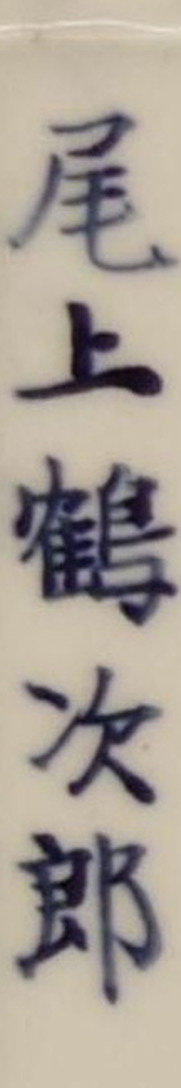尾上鶴次郎

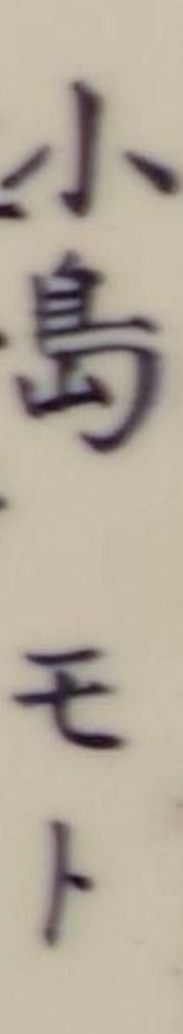小島モト
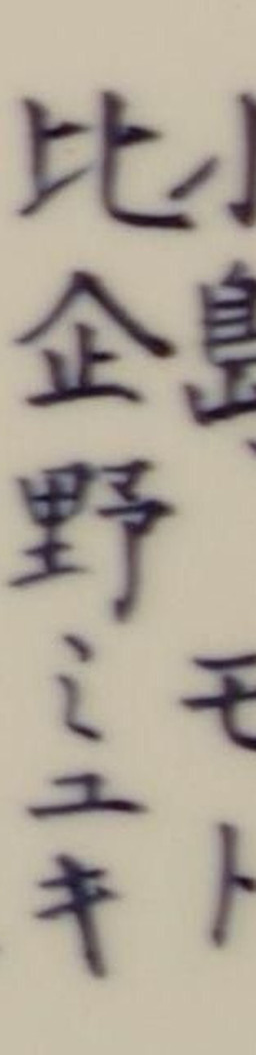比企野ミユキ
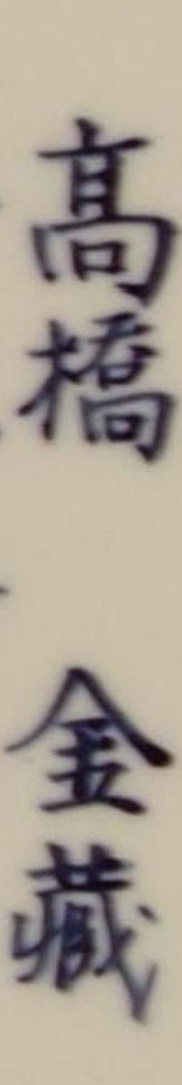高橋金蔵
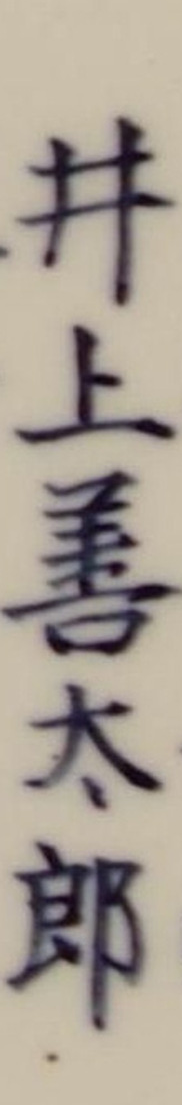井上善太郎
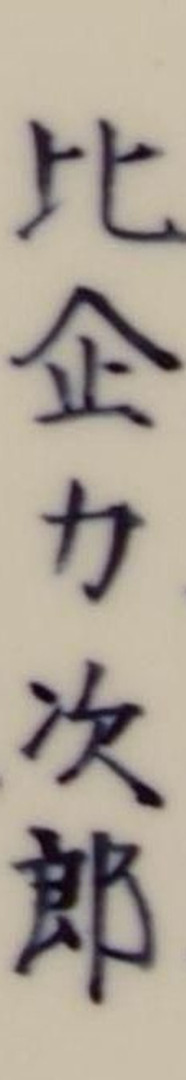比企力次郎
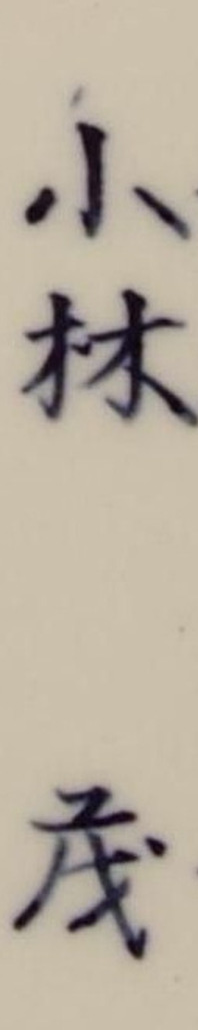小林茂
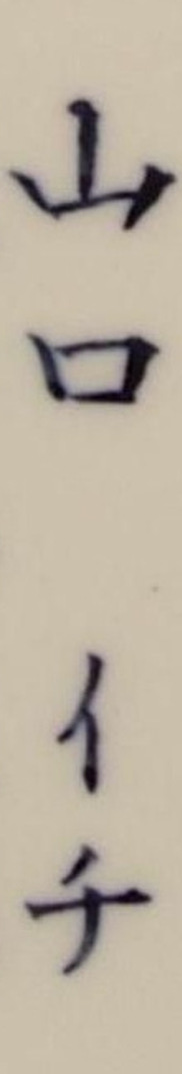山口イチ
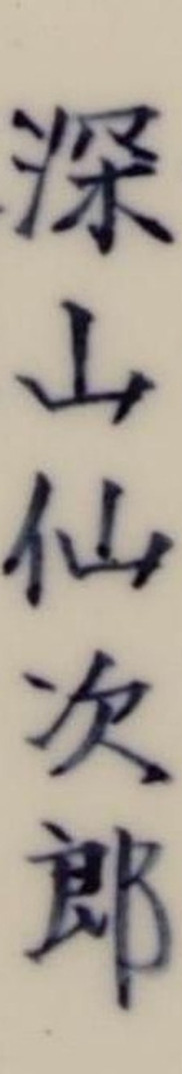深山仙次郎
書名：M~S
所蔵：高野山金剛峯寺
